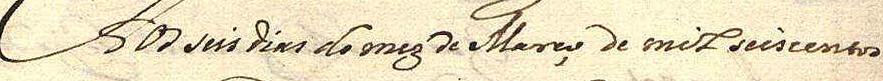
Aos seis dias do mez de Março de miL seiscentos
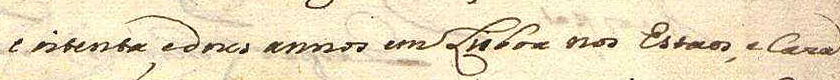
e oitenta, e dous annos em Lisboa nos Estaos, e Caza
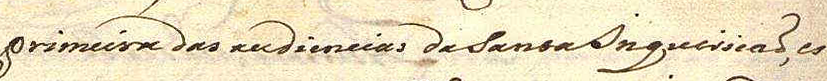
primeira das audiencias da Santa Inquisicaõ, es
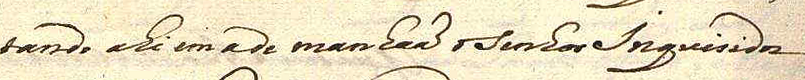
tando ahi em a de manhaã o Senhor Inquisidor
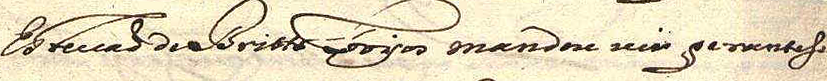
Esteuaõ de Britto Foyos mandou uir perante si
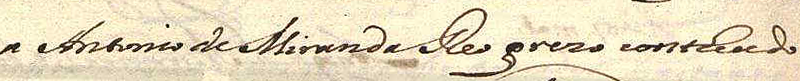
a Antonio de Miranda Reo prezo contheudo
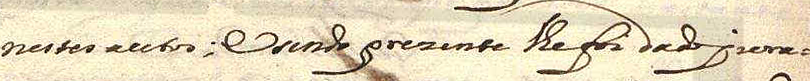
nestes autos: e sendo prezente lhe foi dado jura
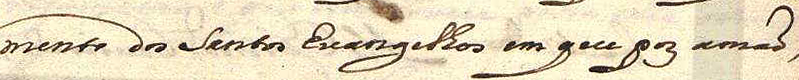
mento dos Santos Euangelhos em que poz a maõ,
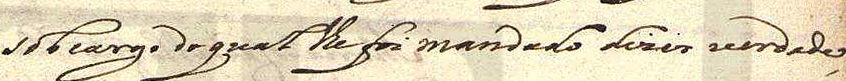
sob cargo do qual lhe foi mandado dizer uerdade,
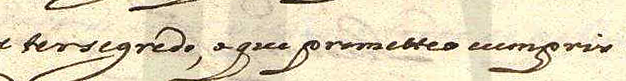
e ter segredo, o que prometteo cumprir.
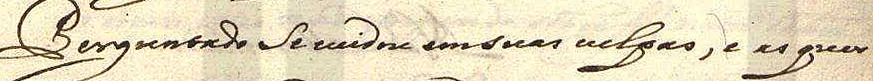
Perguntado se cuidou em suas culpas, e as quer
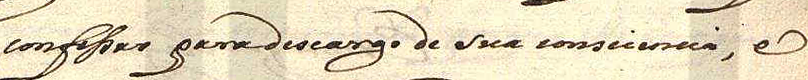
confessar para descargo de sua consciencia, e
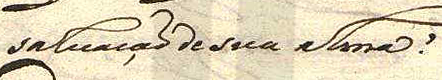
saluaçaõ de sua alma?
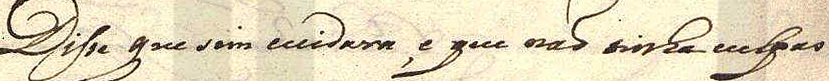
Disse que sim cuidara, e que naõ tinha culpas
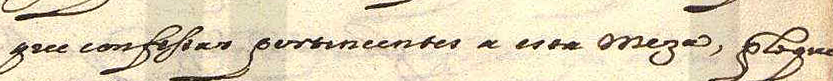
que confessar pertencentes a esta meza, plo que
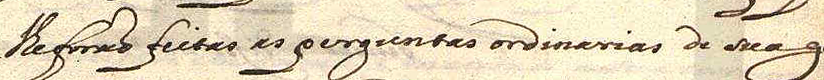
lhe foraõ feitas as perguntas ordinarias de sua ge
